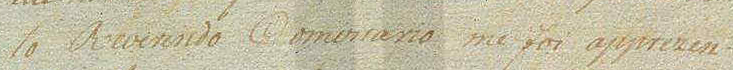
to Reverendo Comissario me foi apprezen
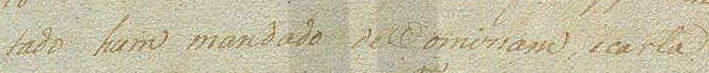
tado hum mandado de Comissam, e carta
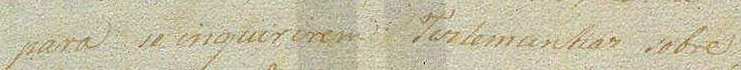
para se inquirirem Testemunhas sobre
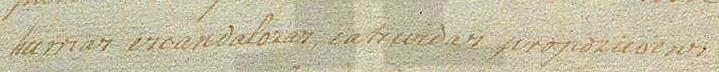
humas escandalozas, e atrevidas propoziçoens
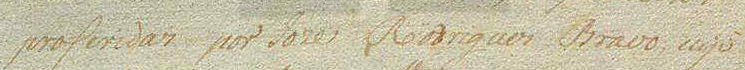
proferidas por Ioze Rodrigues Bravo, cujo
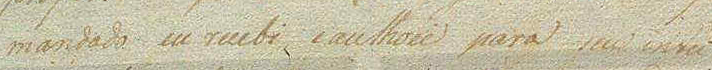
mandado eu recebi e authoei para seu intei
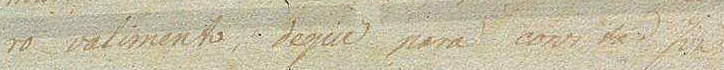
ro valimento, de que para conztar fiz
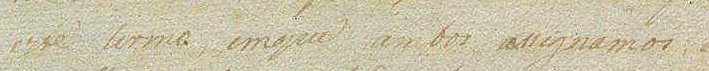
este termo, em que ambos assignamos e
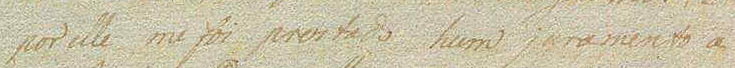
por elle me foi prestado hum juramento a
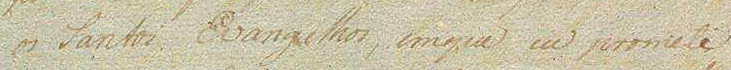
os santos Evangelhos, em que eu promete
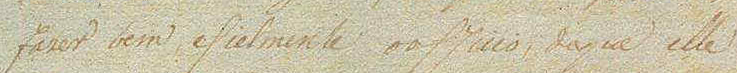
fazer bem e fielmente o officio, de que elle
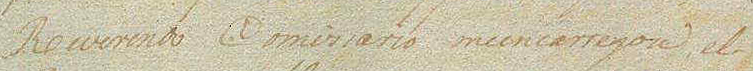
Reverendo Comissario me encarregou, el
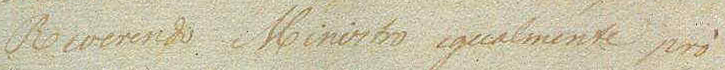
Reverendo Miniztro igualmente pro
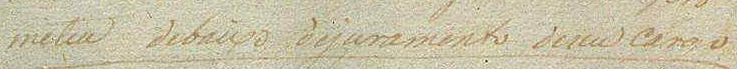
meteu debaixo de juramento de seu cargo
